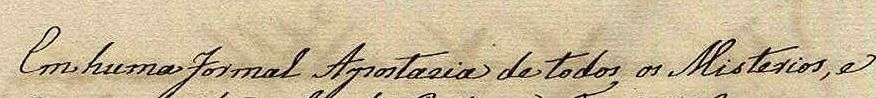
Em huma formal Apostazia de todos os Misterios, e
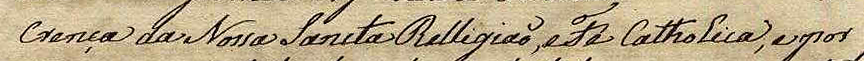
crença da Nossa Sancta Relligiaõ, e Fé Catholica, e por
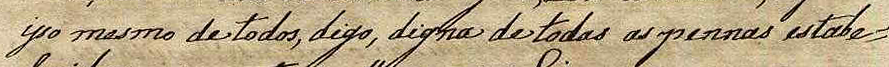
isso mesmo de todos, digo, digna de todas as pennas estabe
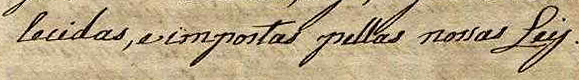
lecidas, e imposta pellas nossas Leis.
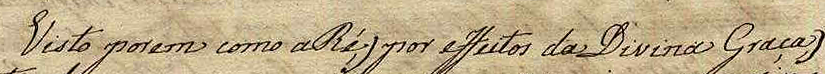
Visto porem como a Ré (por effeitos da Divina Graça,)
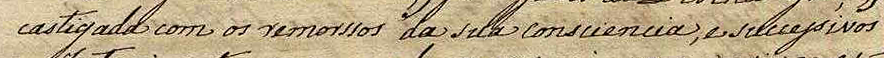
castigada com os remorssos da sua consciencia, e successivos
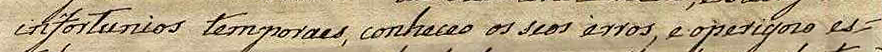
infortunios temporaes, conheceo os seos erros, e o perigozo es
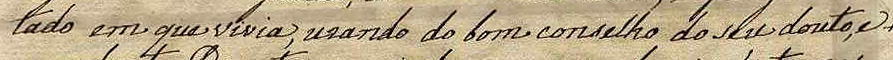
tado em que vivia, uzando do bom conselho do seu douto, e
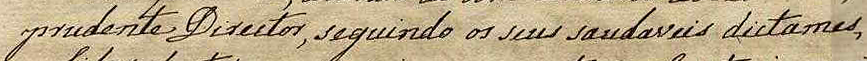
prudente Director, seguindo os seus saudaveis dictames,
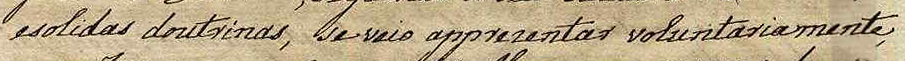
e solidas doutrinas, se veio apprezentar voluntariamente,
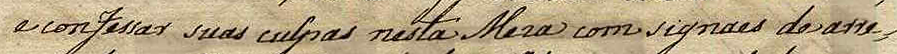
e confessar suas culpas nesta Meza com signaes de arre
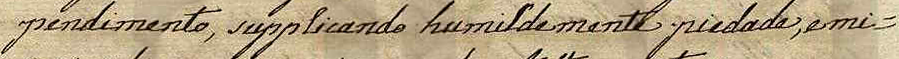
pendimento, supplicando humildemente piedade, e mi
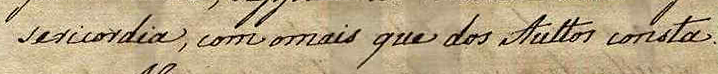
sericordia, com o mais que dos Auttos consta.
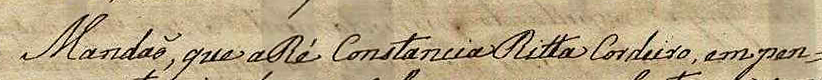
Mandaõ, que a Ré Constancia Ritta Cordeiro, em pen
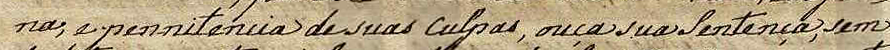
na, e pennitencia de suas culpas, ouça sua Sentença, sem
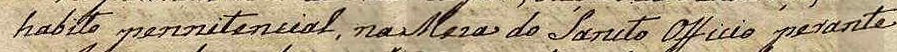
habito pennitencial, na Meza do Sancto Officio perante
